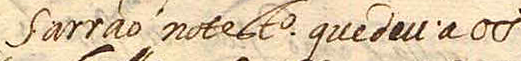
sarrão no testo. que deu aos
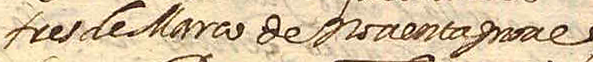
tres de Marco de nouenta y noue
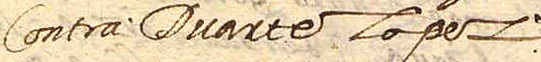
Contra Duarte Lopez
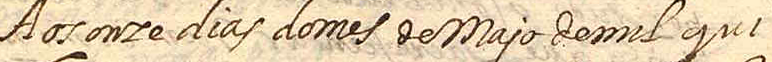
Aos onze dias do mes de majo de mil qui
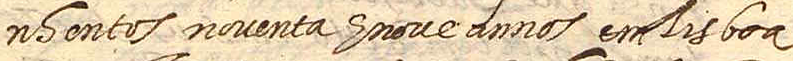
nhentos nouenta E noue annos em Lisboa
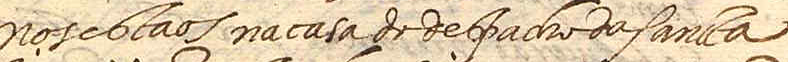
nos estaos na casa do despacho da sancta
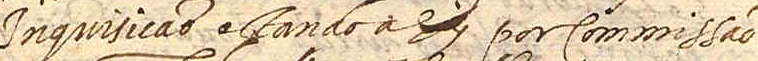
Inquisicaõ estando ahy por Commissão
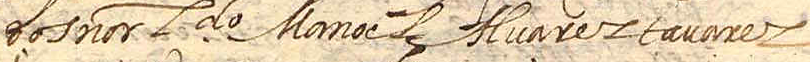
do sn̄or L.do Manoel Aluarez tauarez
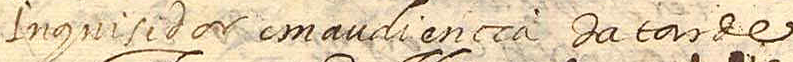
Inquisidor em audiencia da tarde
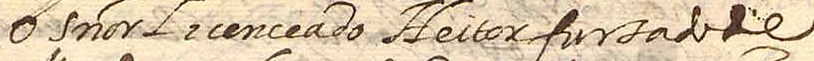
o sn̄or Licenceado Heitor furtado de
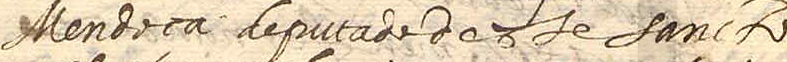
Mendoça deputado deste sancto
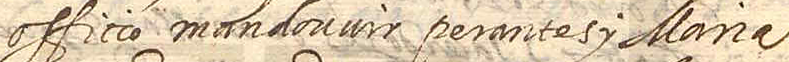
officio mandou uir perante sy Maria
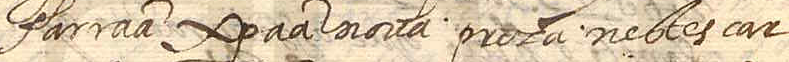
Sarraã xpaã noua preza nestes car
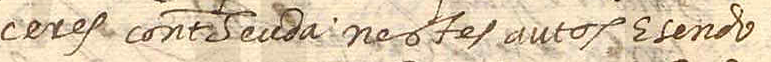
ceres contheuda nestes autos E sendo
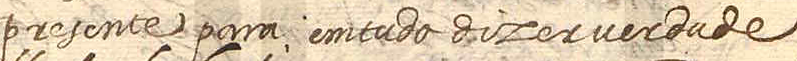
presente para em tudo dizer uerdade
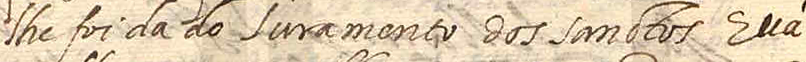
lhe foi dado Iuramento dos sanctos Euā
